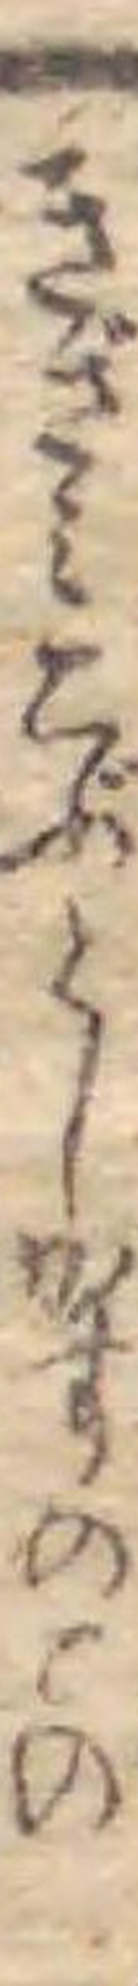きざみこぶとしかすのこの
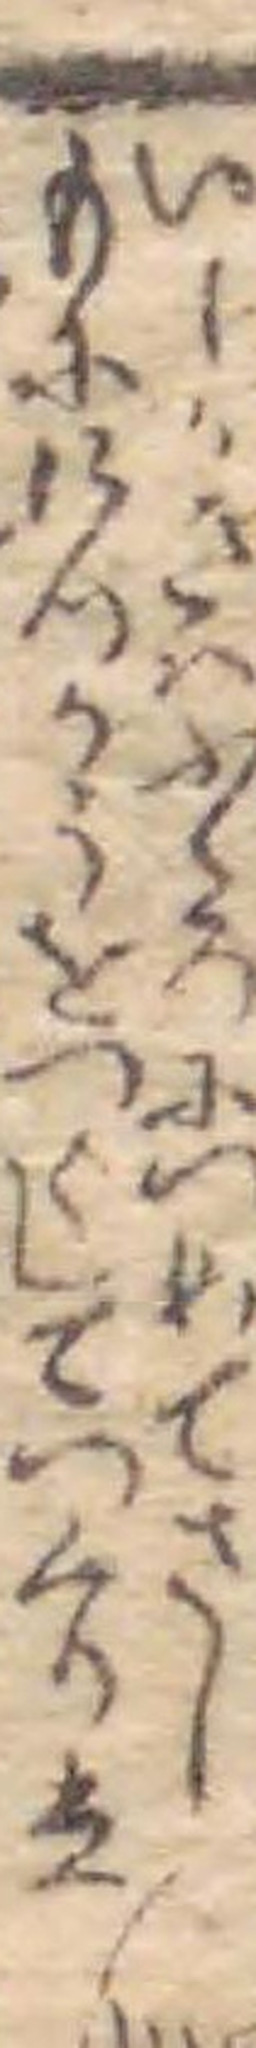もにけつかうをつくしてつくり立たる
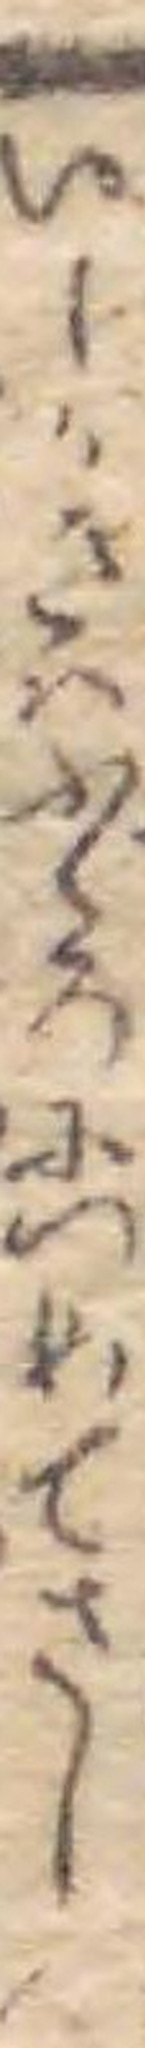いしがきはふくろにつめてさし
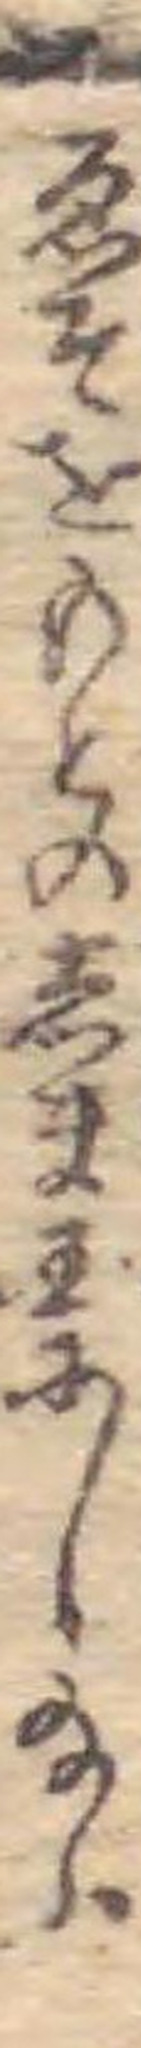ゑそをもとのしま国にし給ふ
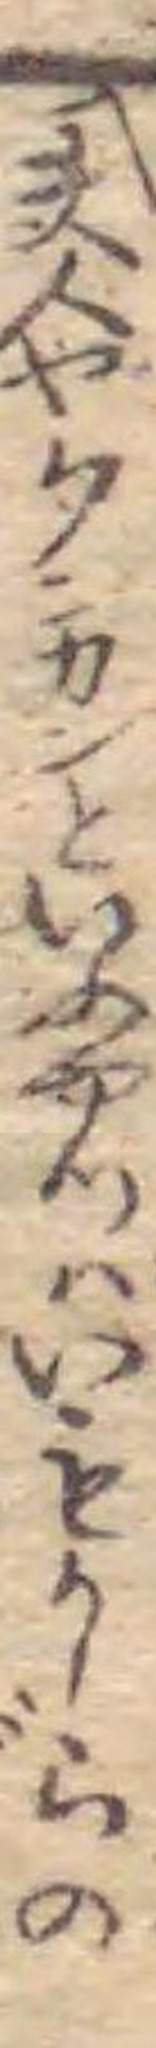〽夫人やタンカンといふやつはいもかしらの
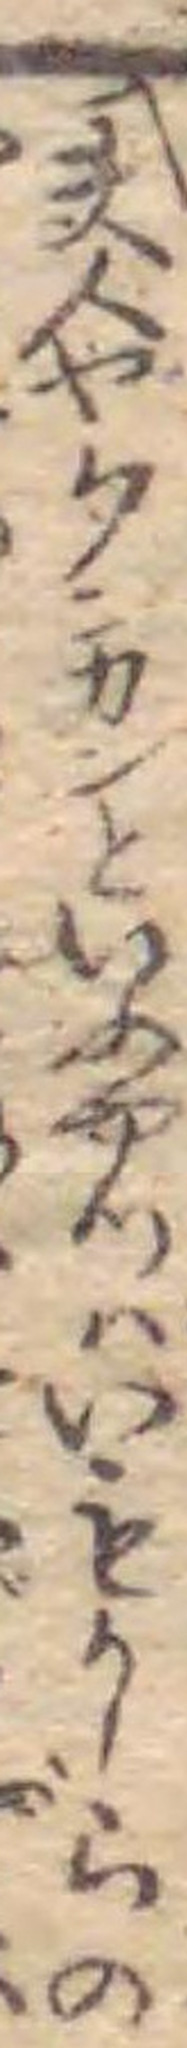〽夫人やタンカンといふやつはいもかしらの
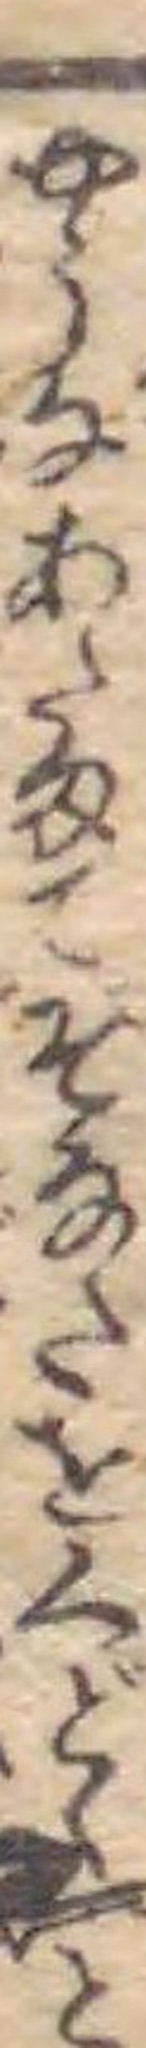やうなあたまてそなたをくどくとは
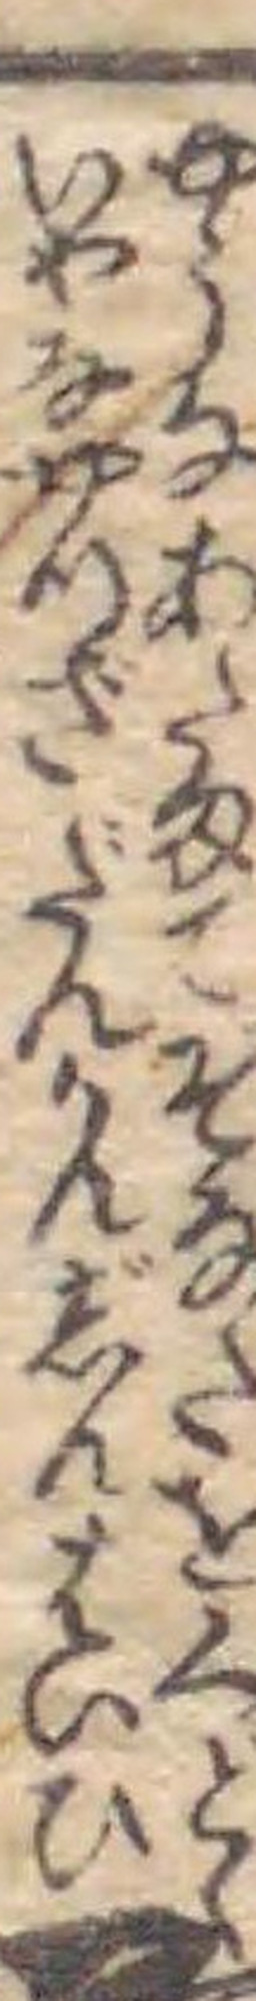いやなやつだだんかんじんはいひ
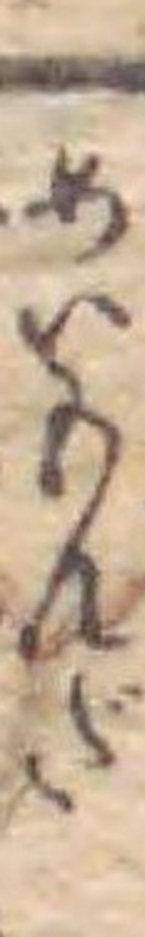めいもんだ
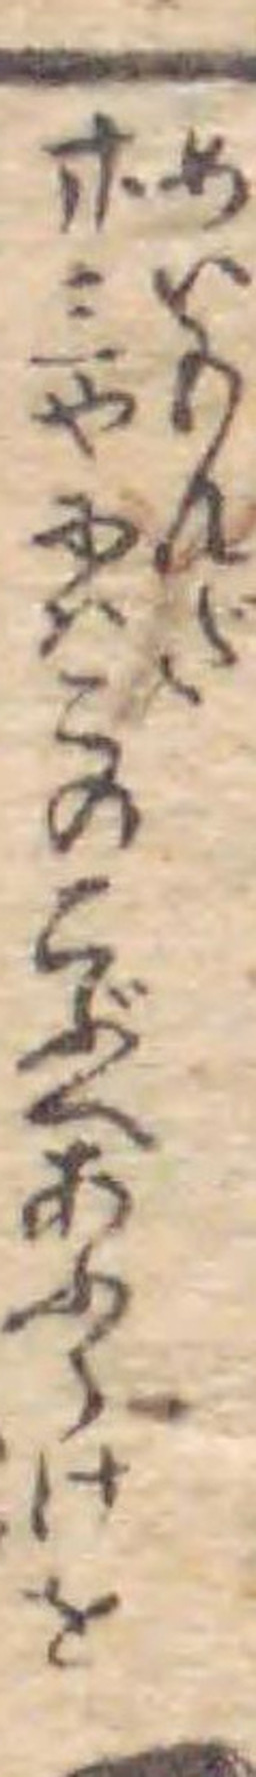廿三やにはこのこぶへあふらけを
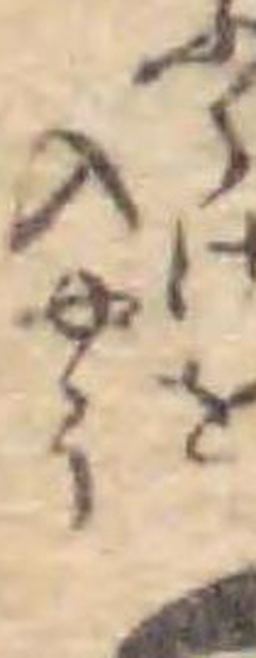入やう
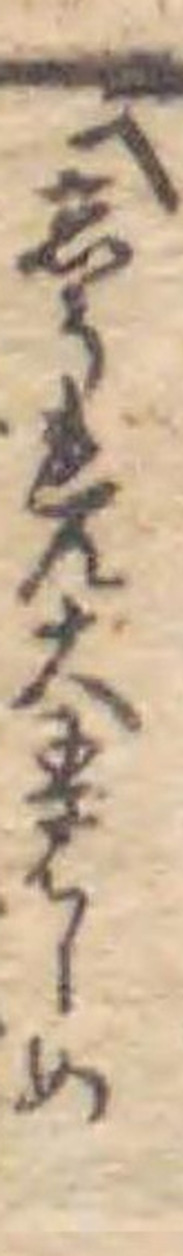〽しうれん大王はしめ
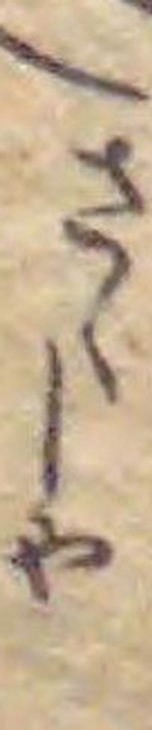さくしや
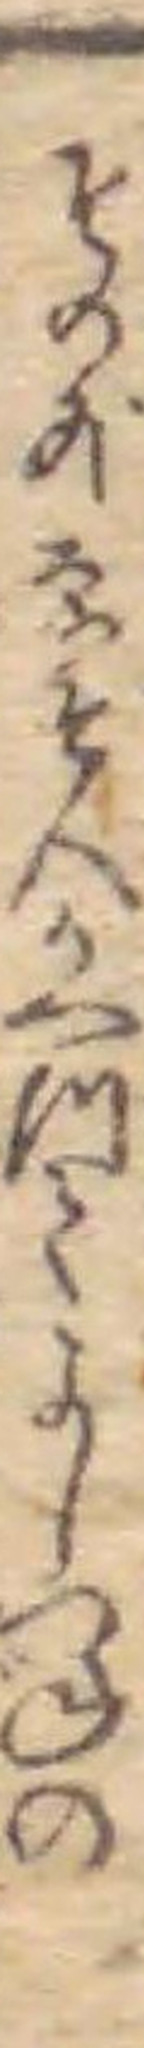その外ゑそ人かへつてよしつねの
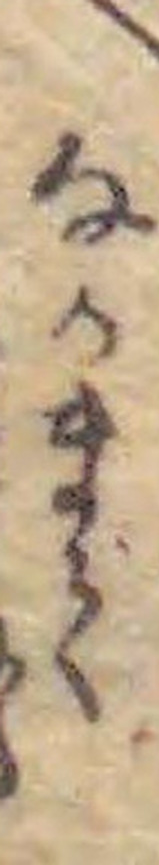なかまて
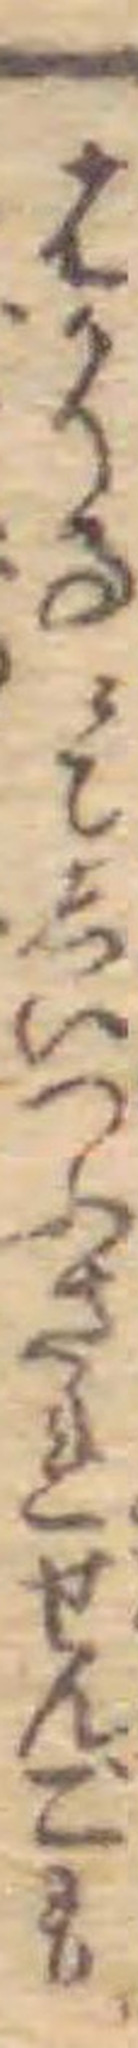はかり事にてしいつふされぜんごも
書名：悦贔負蝦夷押領 : 3巻
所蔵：国立国会図書館 National Diet Library, JAPAN
